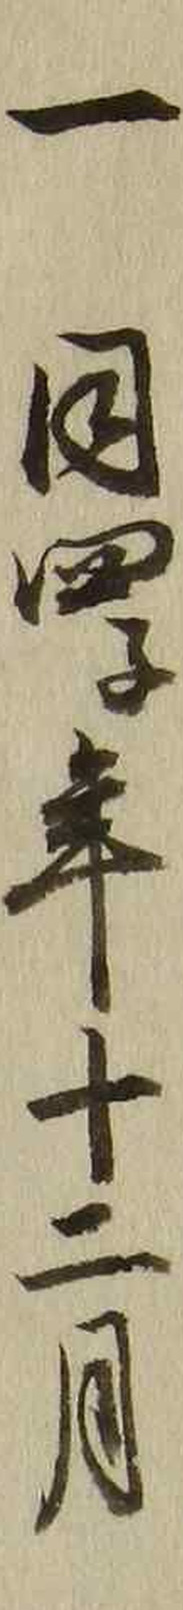一同四子年十二月
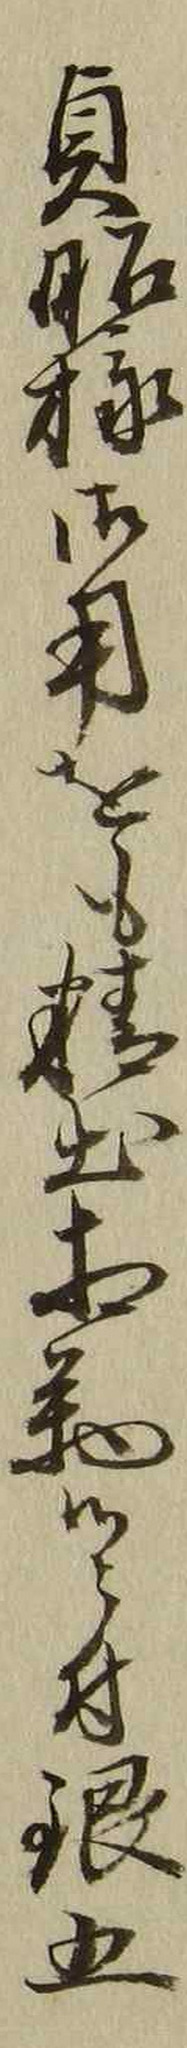貞昭様御用をも精出相勤候ニ付銀五
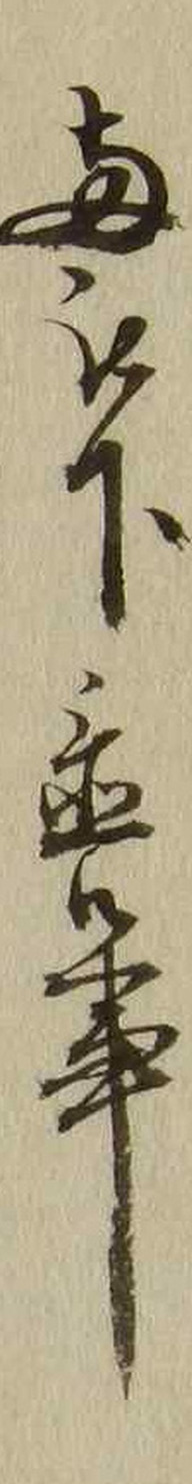両被下置候事
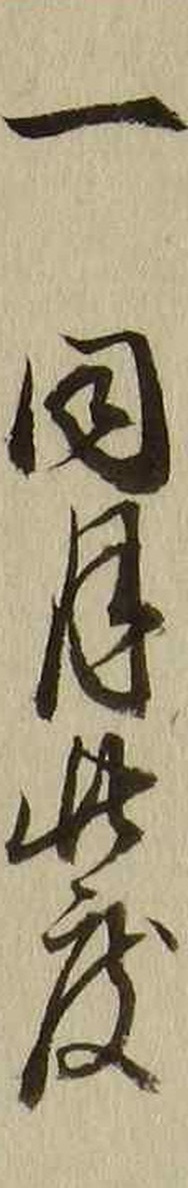一同月此度
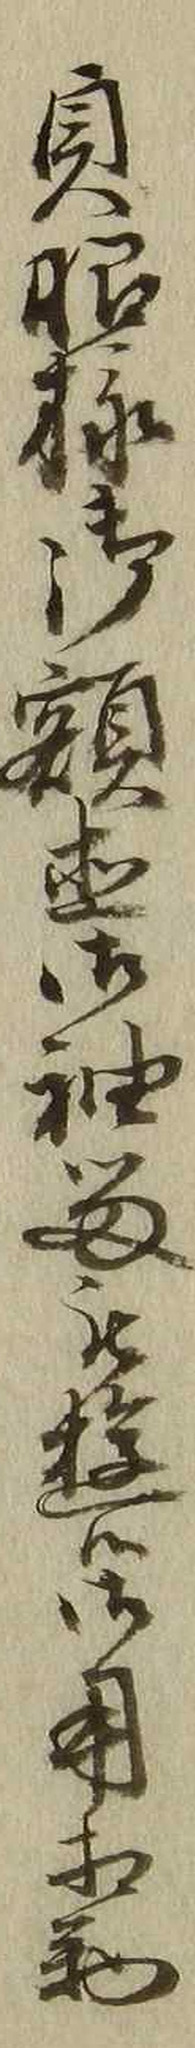貞昭様御御額直御袖留被遊候御用相勤
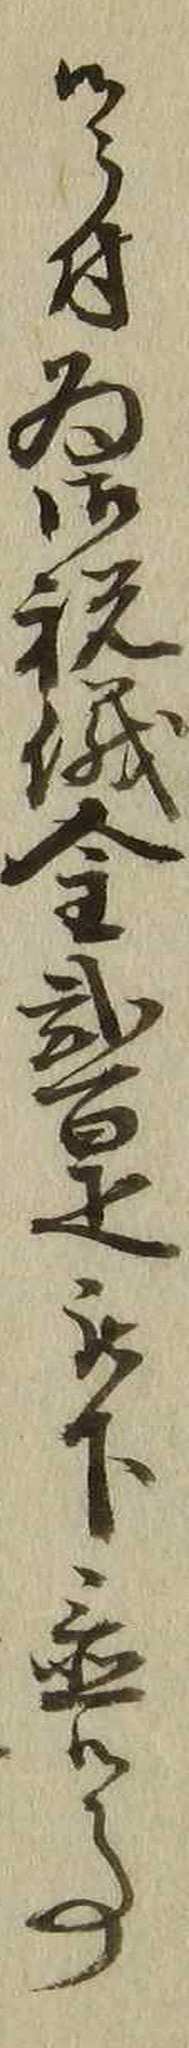候ニ付為御祝儀金二百疋被下置候事
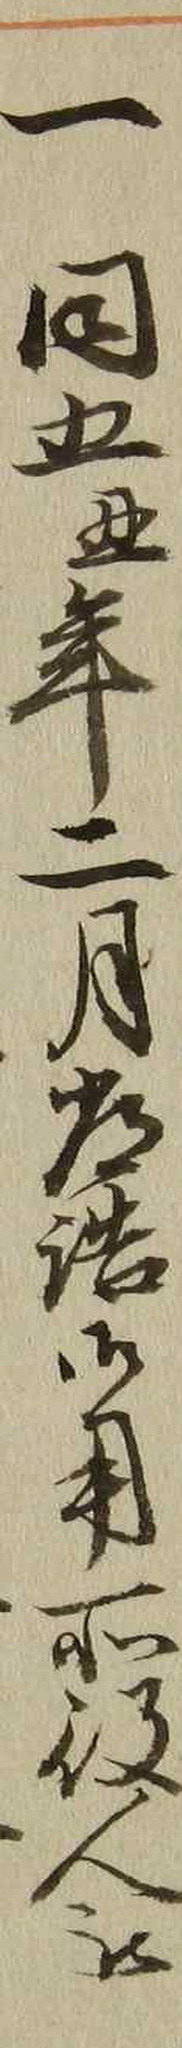一同五丑年二月常詰御用所役人被
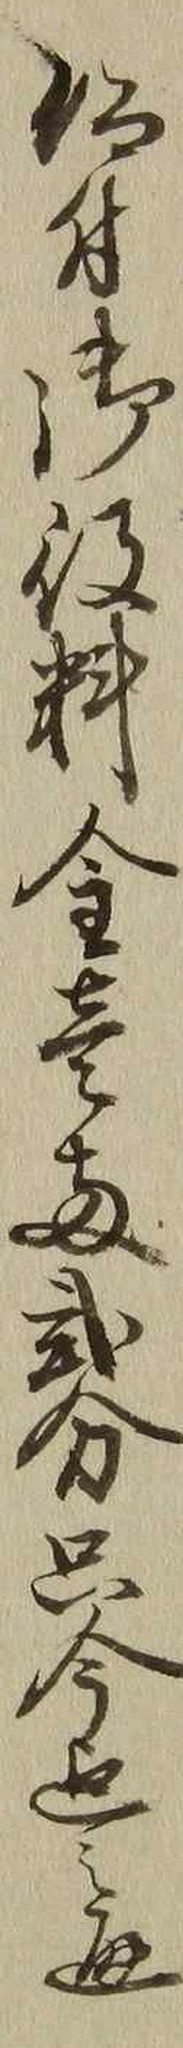仰付御役料金壱両弐分只今迄之通
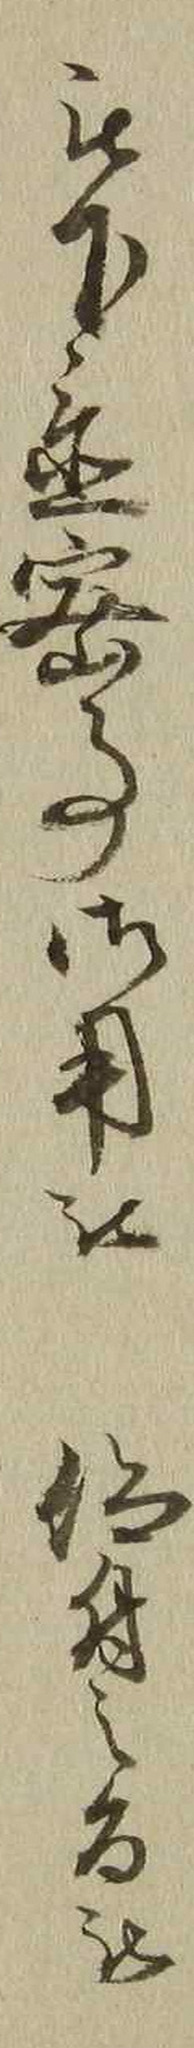被下置密事御用被仰付之旨被
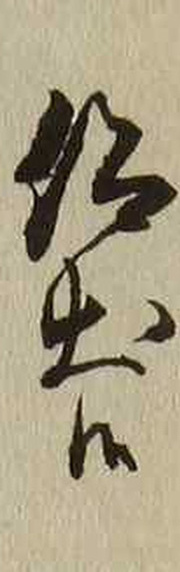仰出候
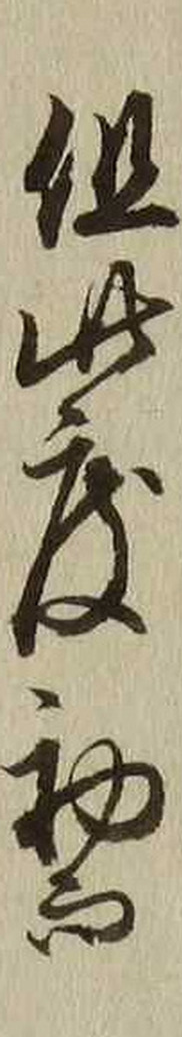但此度初而
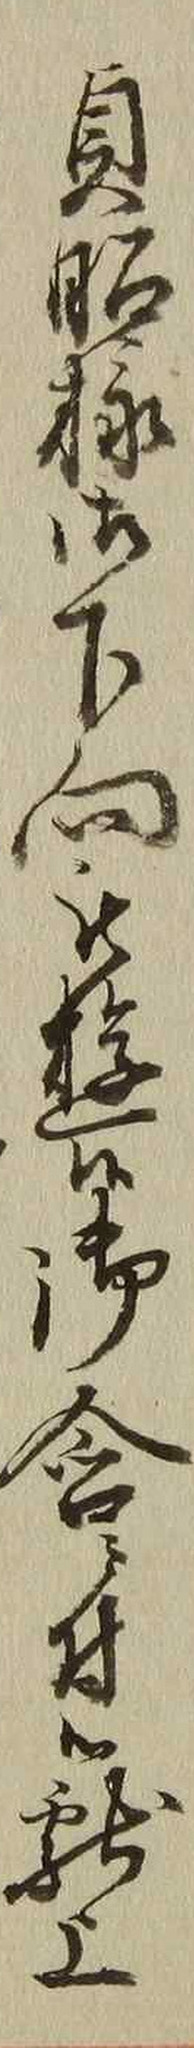貞昭様御下向被遊候御含ニ付御献上
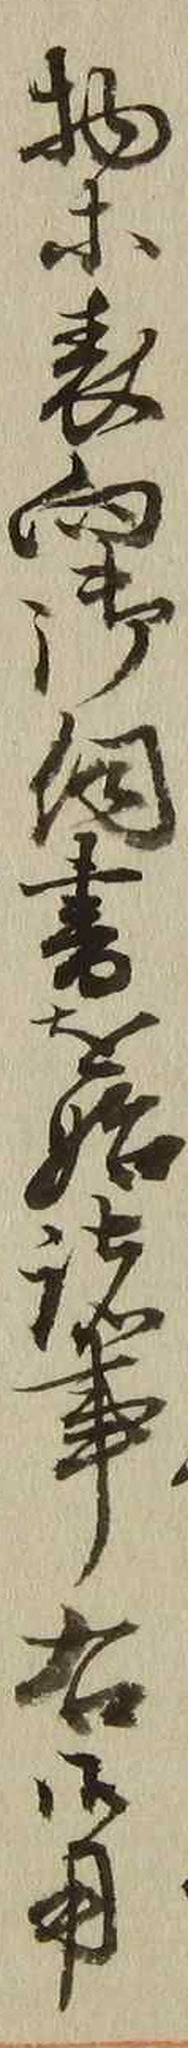物等表向御伺書を始諸事右御用
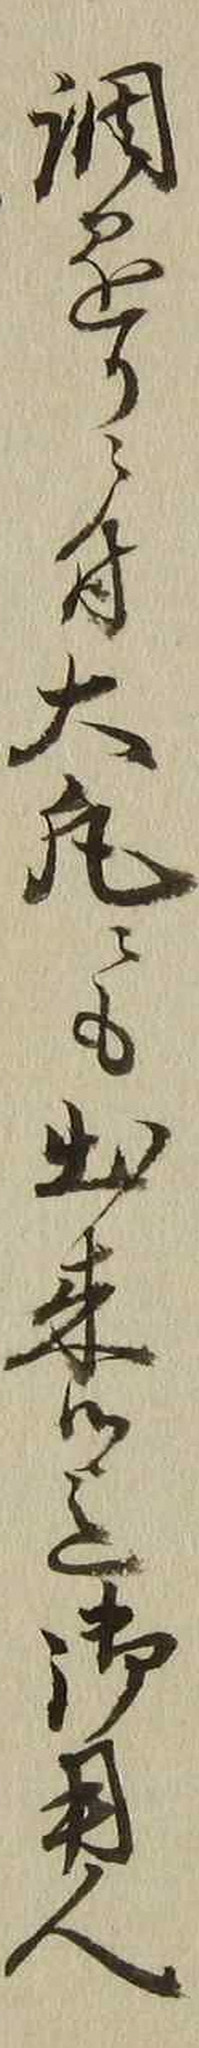調懸りニ付大凡ニも出来候迄御用人
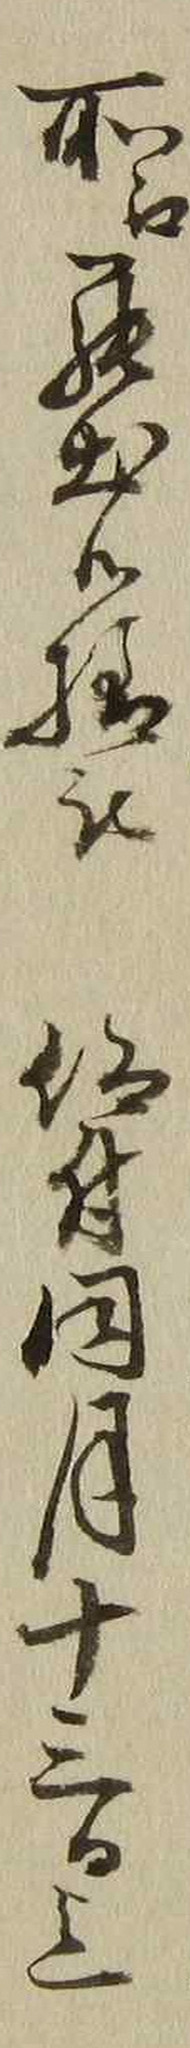所江罷出候様被仰付同月十三日迄
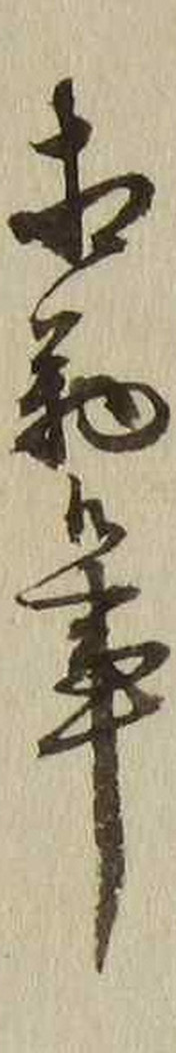相勤候事
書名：諸士系譜　巻之64　と之部7
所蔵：会津若松市立会津図書館
